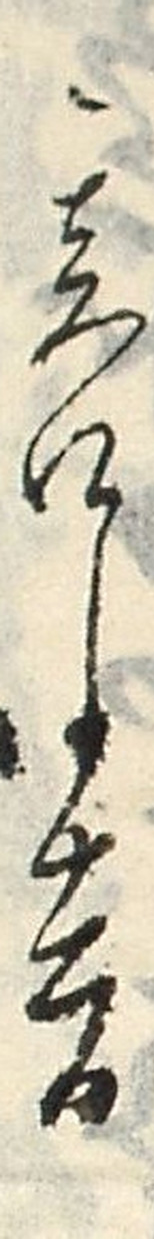亥四月十二日

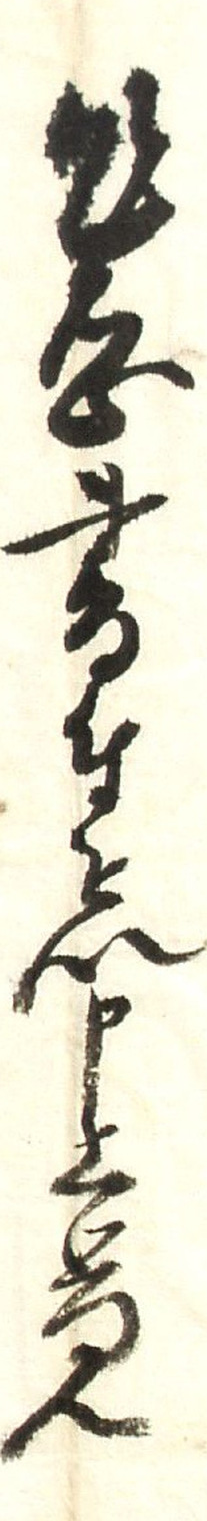乍恐書付を以申上覚
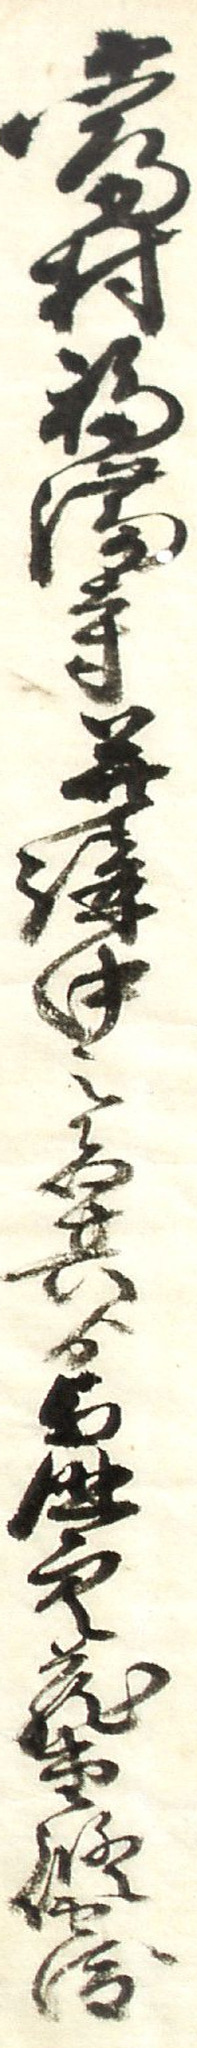當村福満寺幷講中之者共ゟ虚空蔵堂修覆
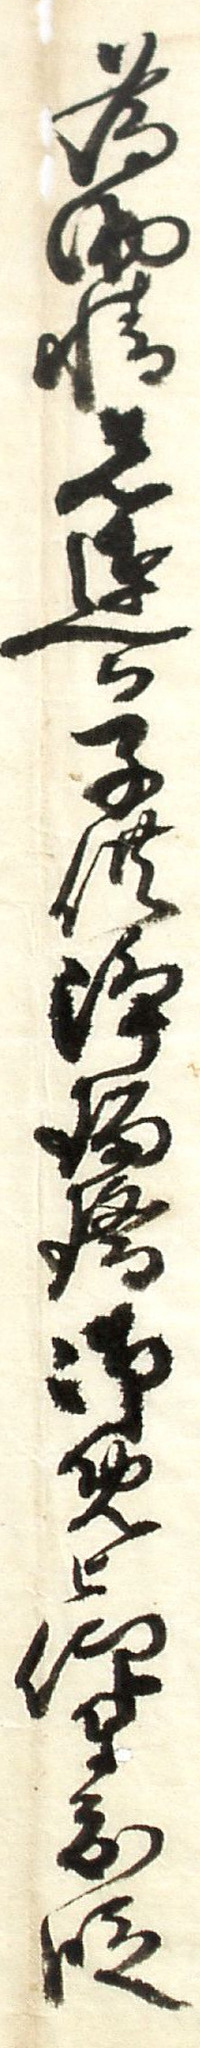為助情先達而子供浄瑠璃御免被仰付度段
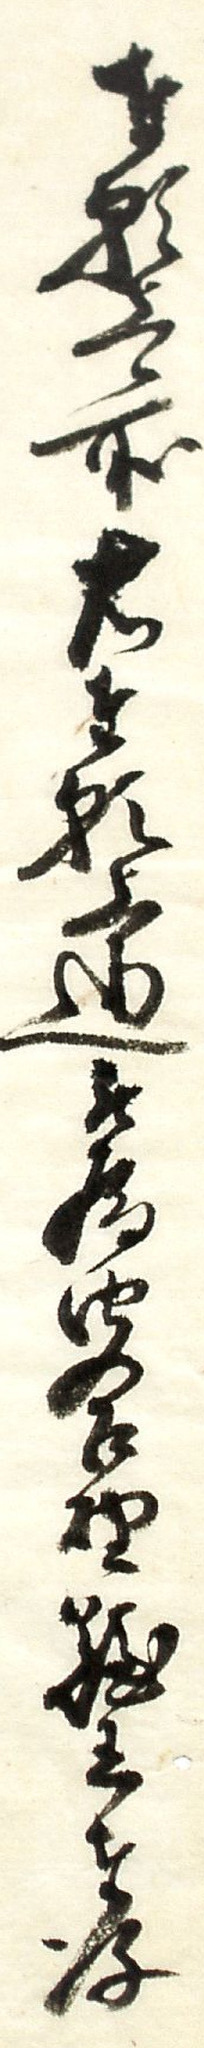奉願上候所右奉願上通被為聞召届難有奉存
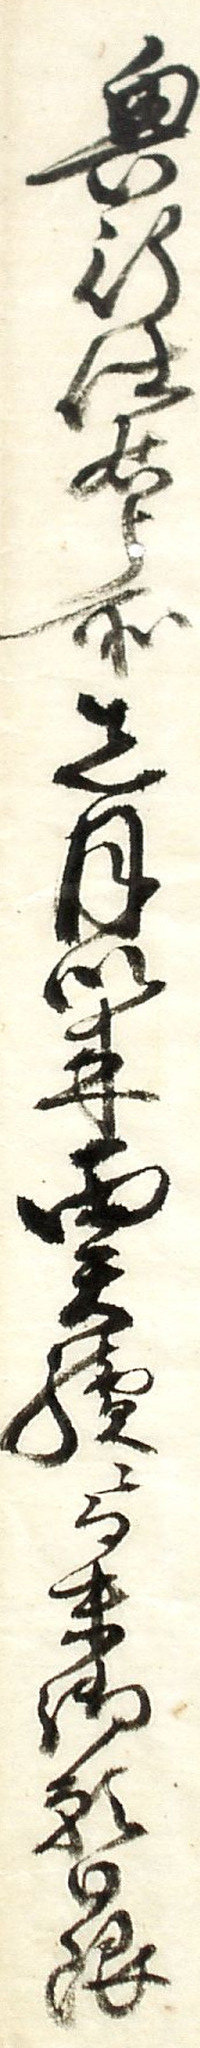興行仕居申所先月以来雨天續ニ而未御願日限
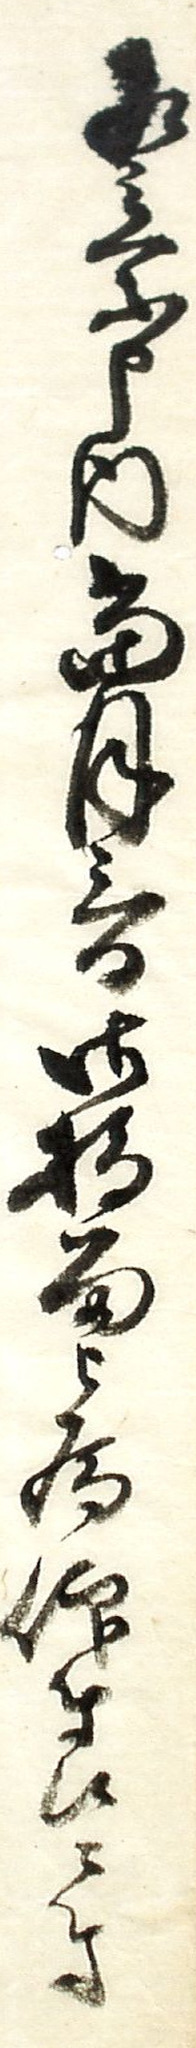相立不申内當月三日御指留被為仰付候ニ付
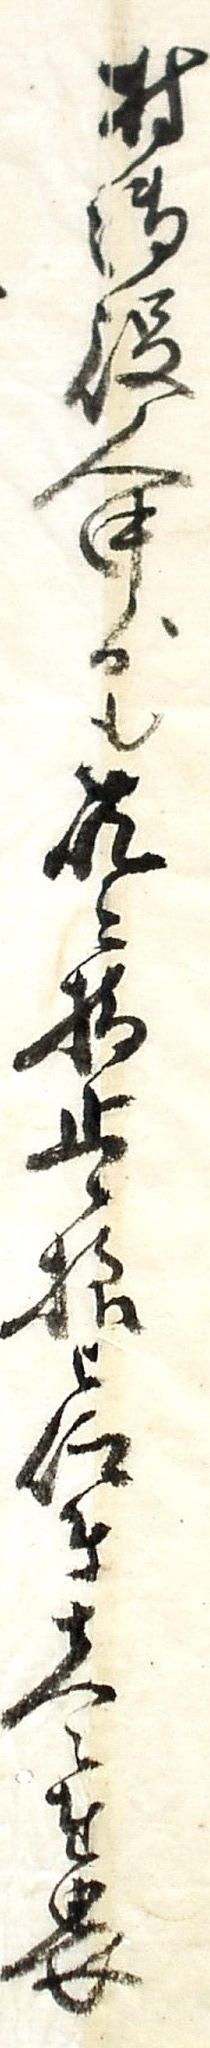村御役人中ゟも屹と指止候様被仰付夫々奉畏
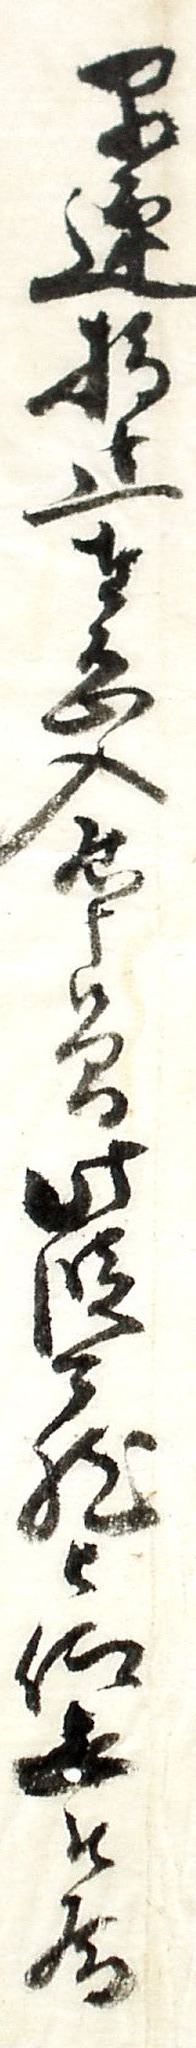早速指止奉恐入居申候間此段可然被仰上被為
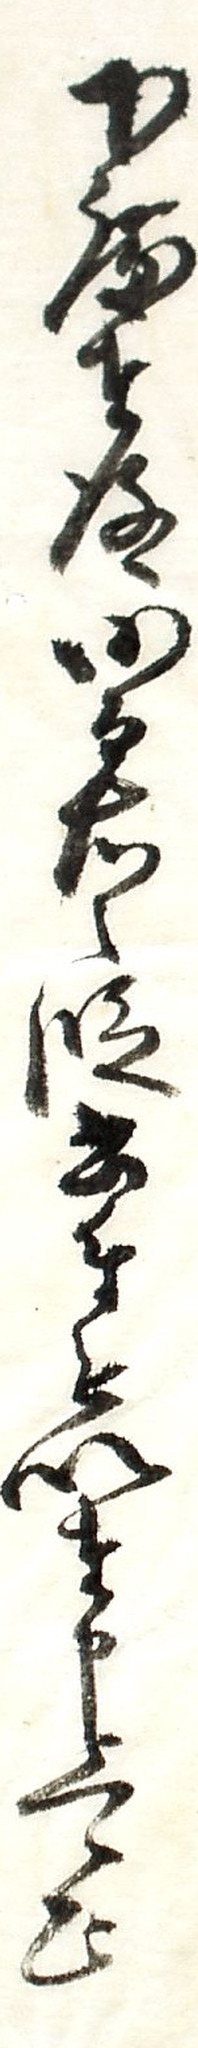下度奉存候仍而右之段書付を以奉申上候以上
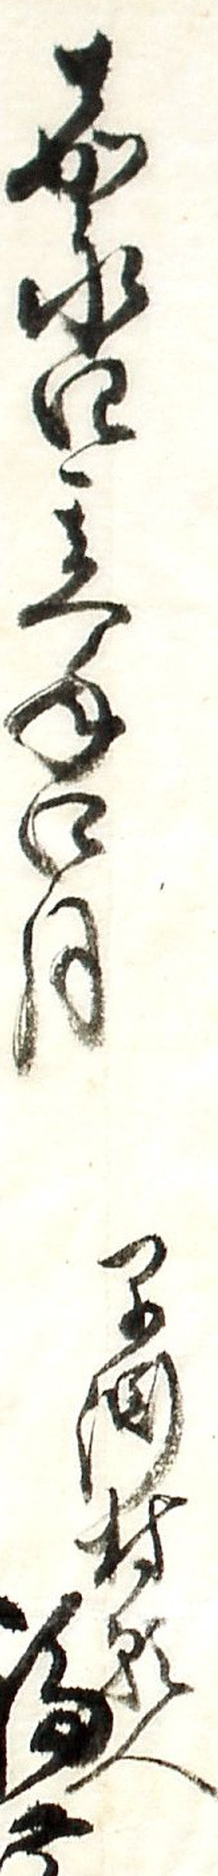嘉永四亥年四月早渕村願人
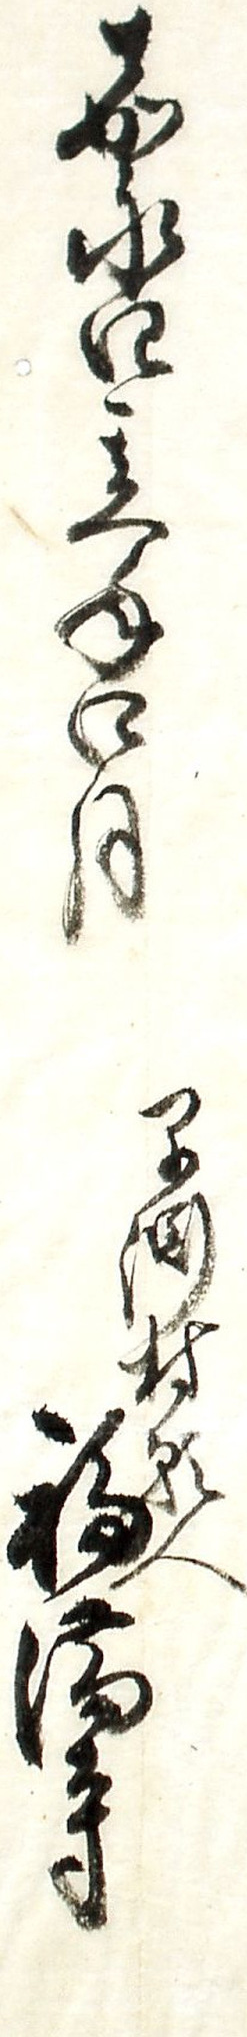嘉永四亥年四月早渕村願人
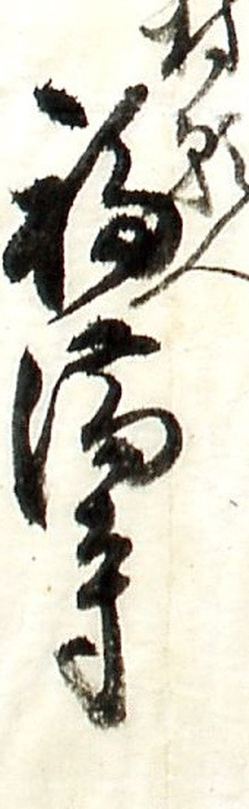福満寺
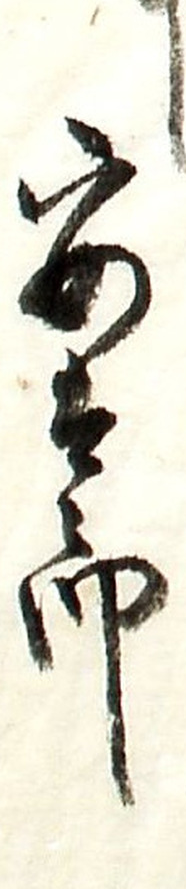安太郎
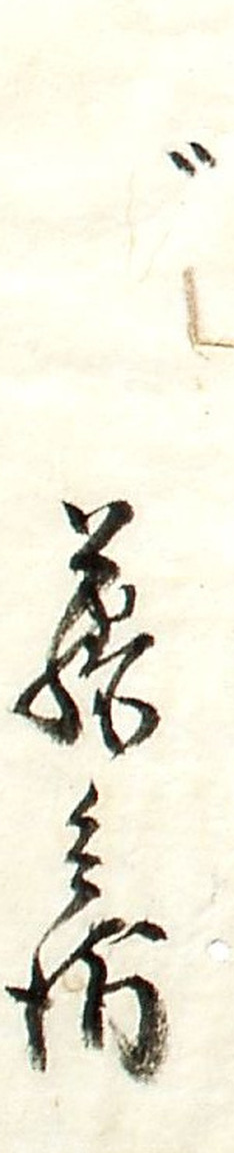藤兵衛
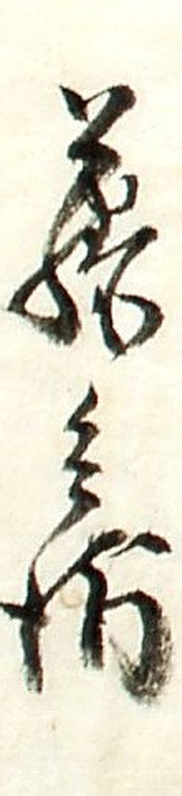藤兵衛
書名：(早渕村福満寺子供浄瑠璃願書）他
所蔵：鳴門教育大学 Naruto University of Education
